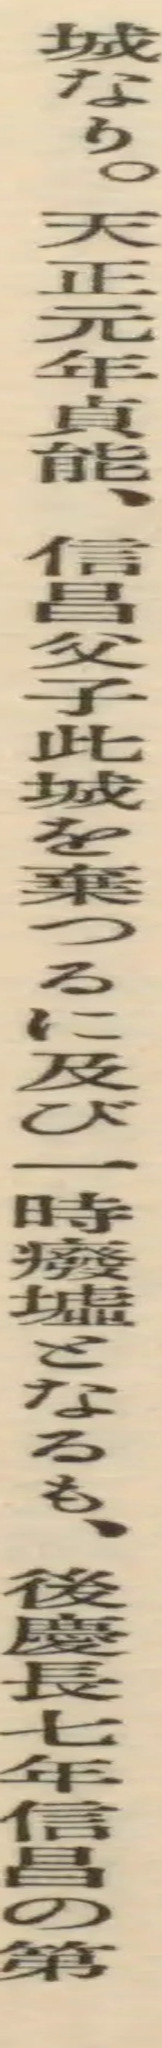城なり。天正元年貞能、信昌父子此城を棄つるに及び一時廃墟となるも、後慶長七年信昌の第
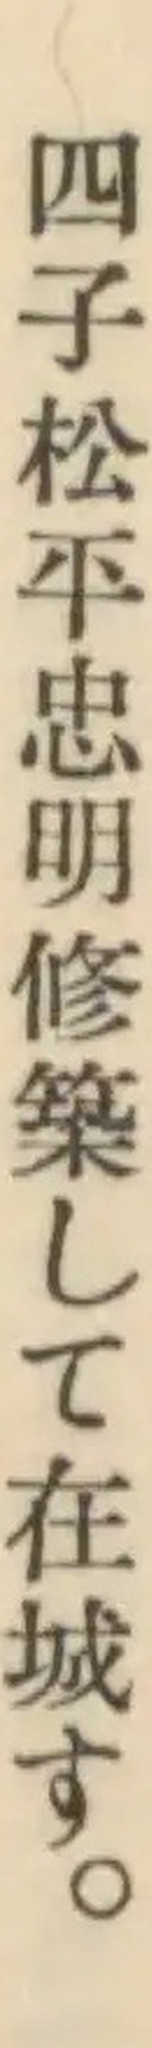四子松平忠明修築して在城す。
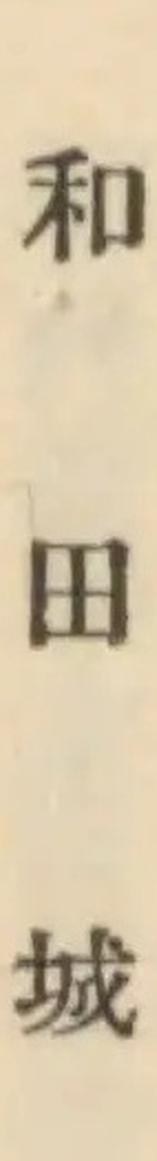和田城
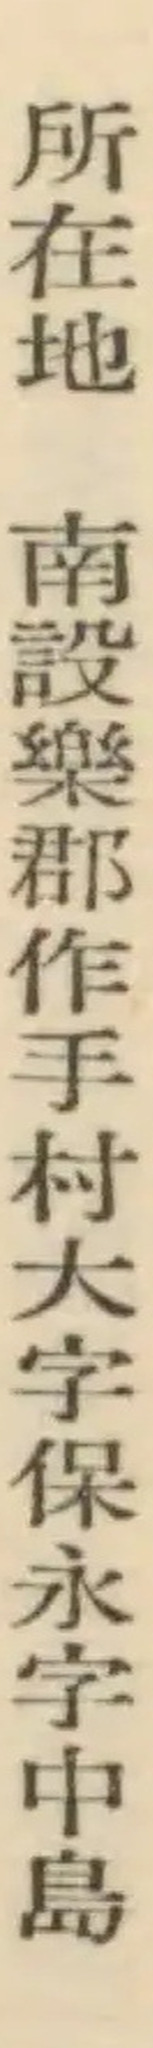所在地南設楽郡作手村大字保永字中島
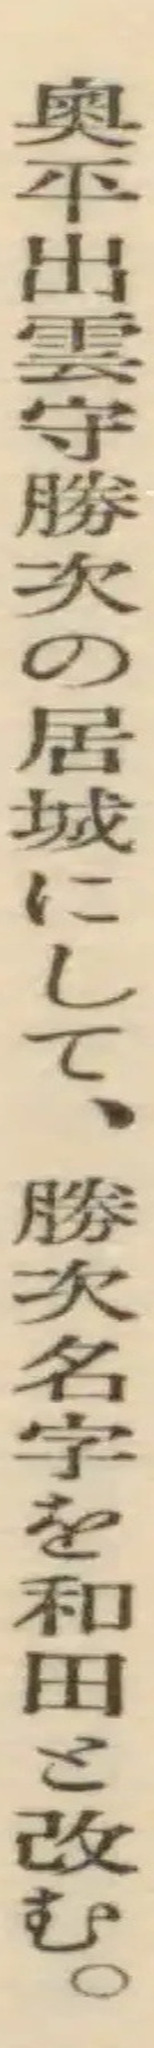奥平出雲守勝次の居城にして、勝次名字を和田と改む。
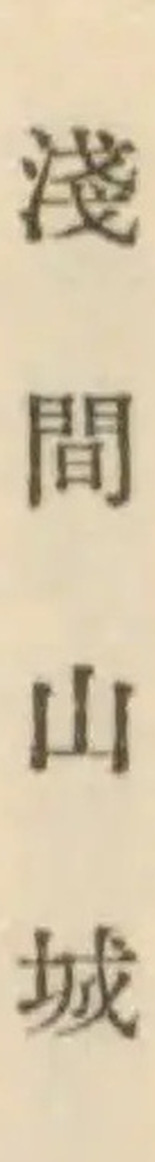浅間山城
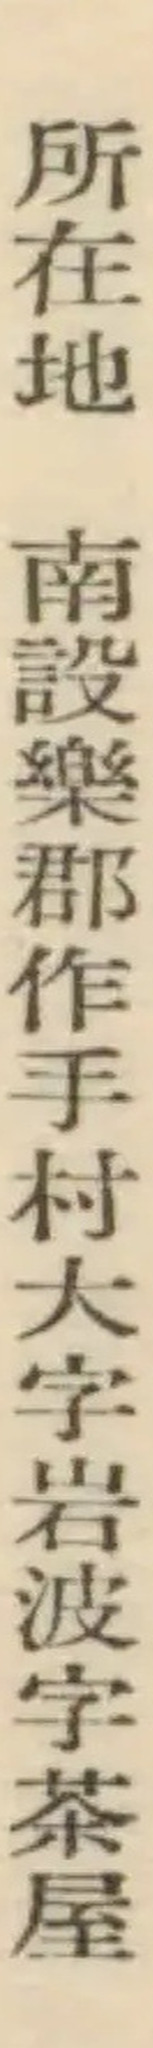所在地南設楽郡作手村大字岩波字茶屋
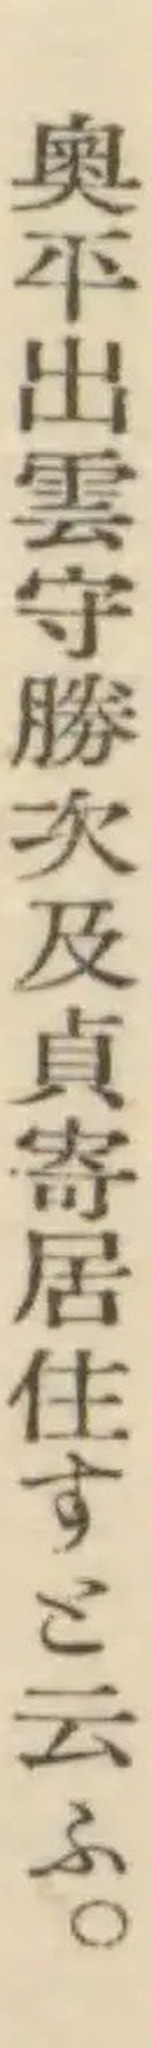奥平出雲守勝次及貞寄居住すと云ふ。
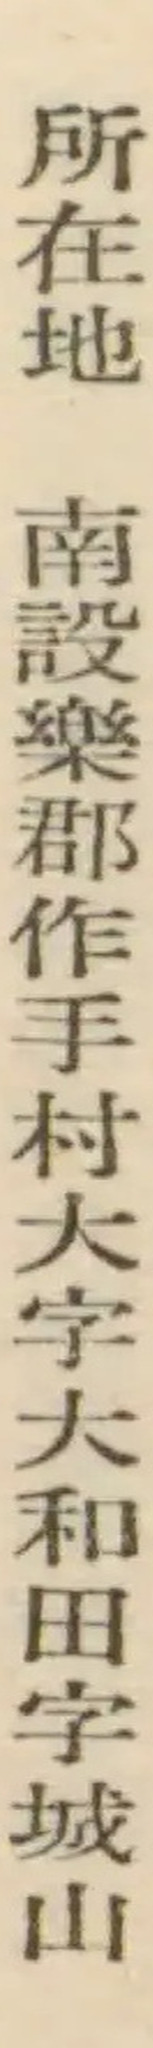所在地南設楽郡作手村大字大和田字城山
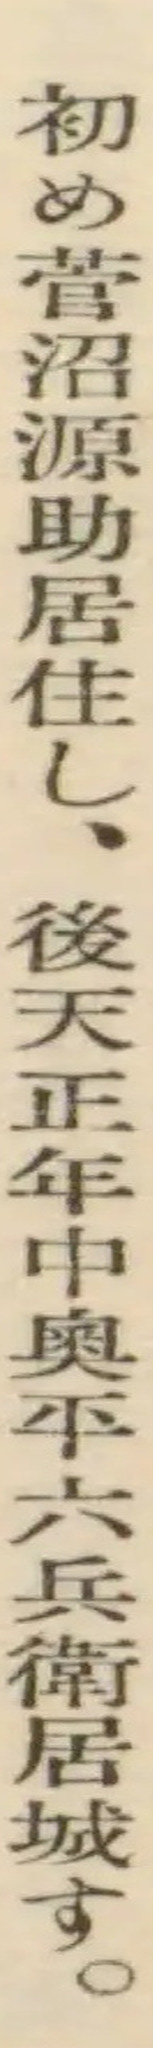初め菅沼源助居住し、後天正年中奥平六兵衛居城す。
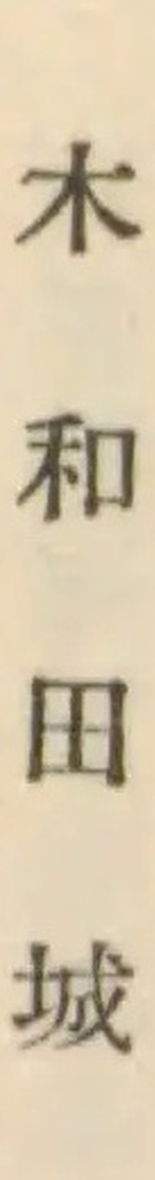木和田城
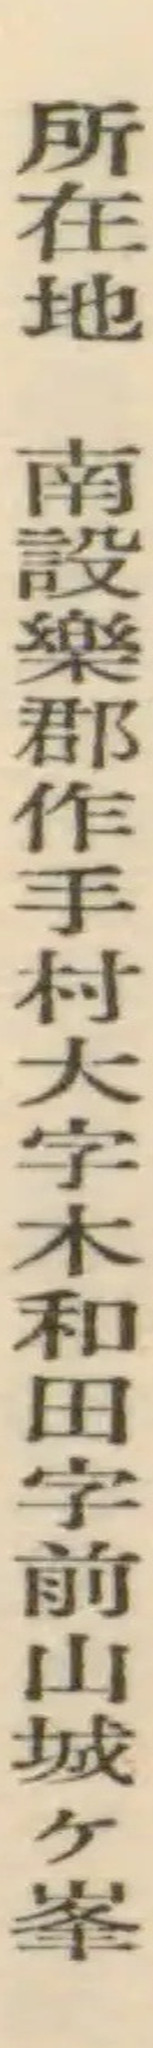所在地南設楽郡作手村大字木和田字前山城ケ峯
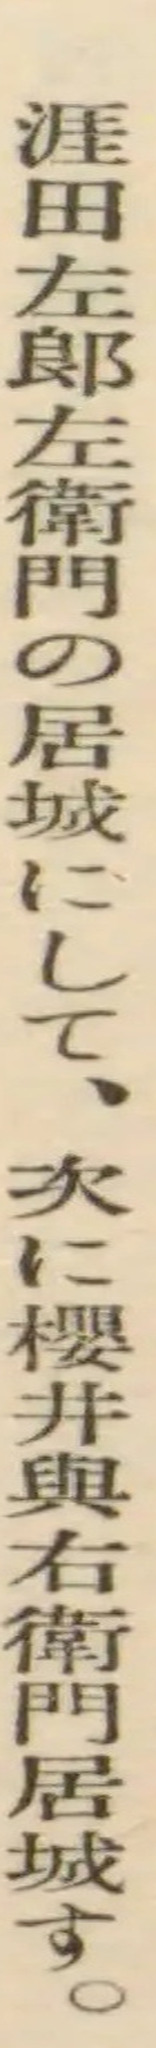涯田左郎左衛門の居城にして、次に桜井与右衛門居城す。
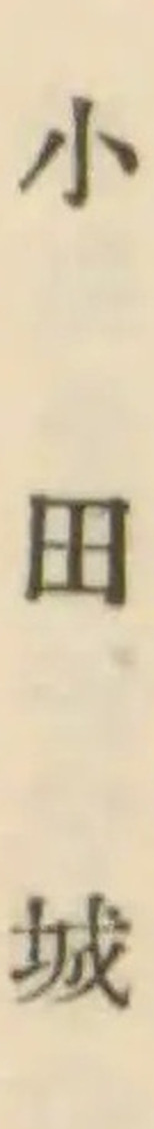小田城
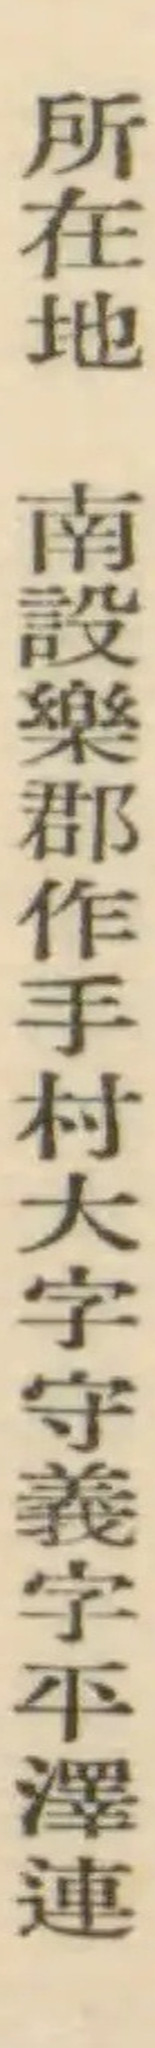所在地南設楽郡作手村大字守義字平澤連
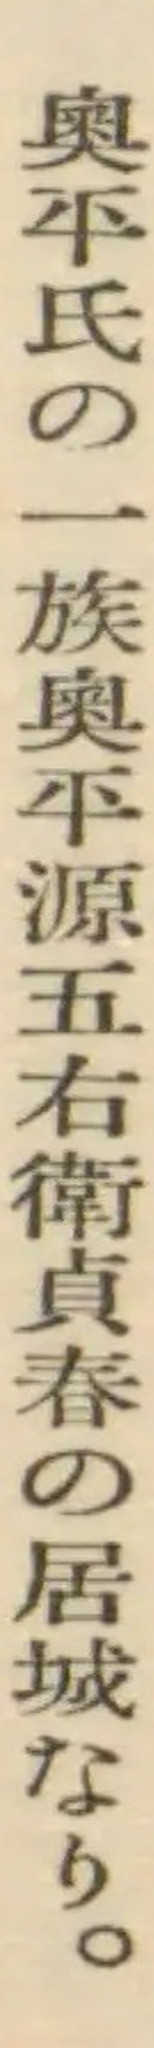奥平氏の一族奥平源五右衛門貞春の居城なり。
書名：東三河之古城
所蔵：国立国会図書館 National Diet Library, JAPAN
